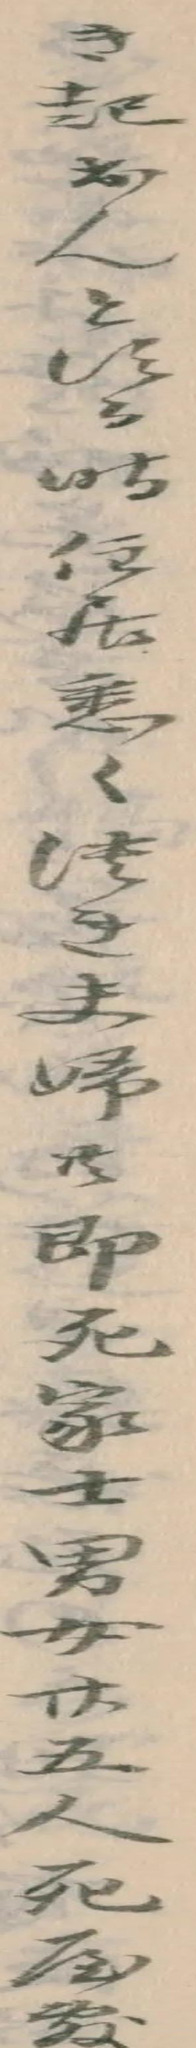き起出んとする時住居悉く潰れ夫婦共即死家士男女二十五人死屋敷
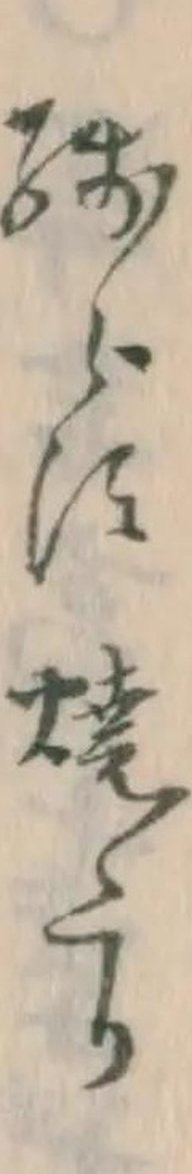残らす焼たり
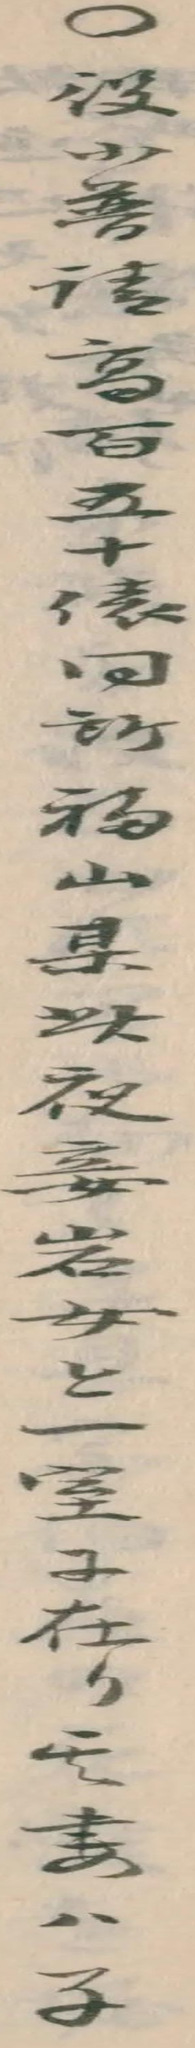〇役小普請高百五十俵同所福山某此夜妾岩女と一室に在り其妻は子
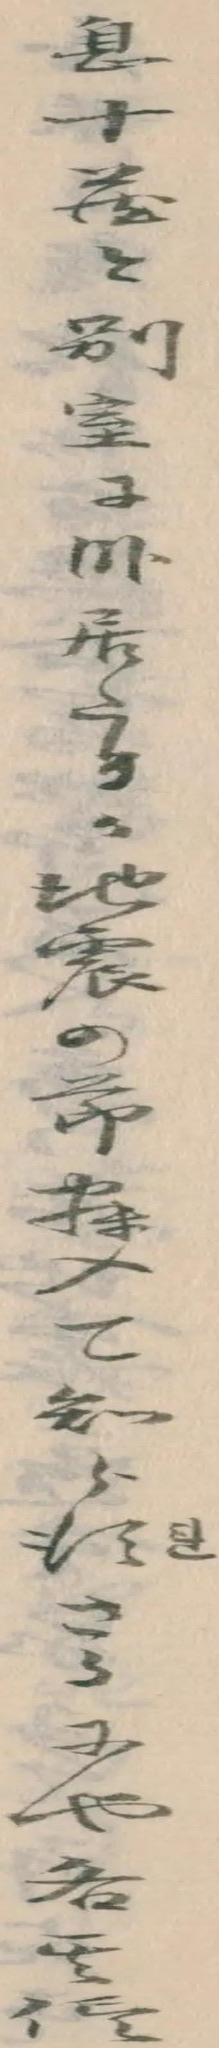息十蔵と別室に候居たるか地震の節寝入て知らすさるにや各其侭
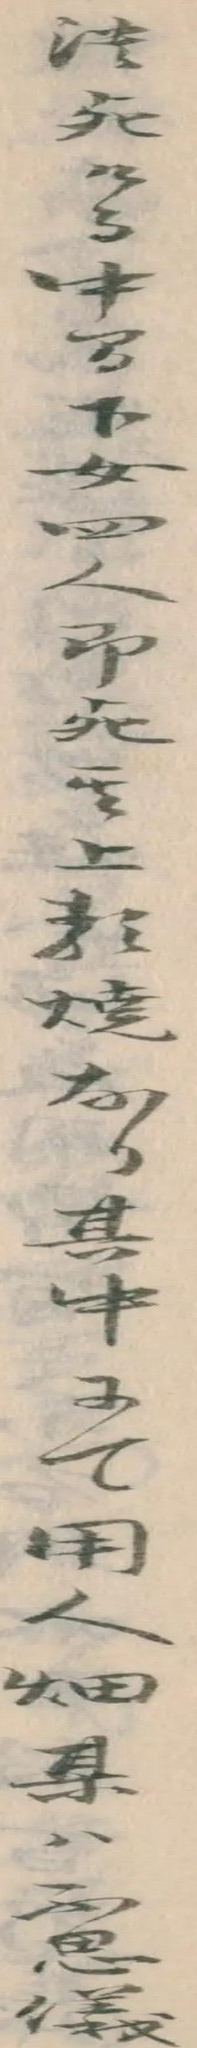潰死ける中間下女四人即死其上類焼なり其中にて用人畑某は不思儀
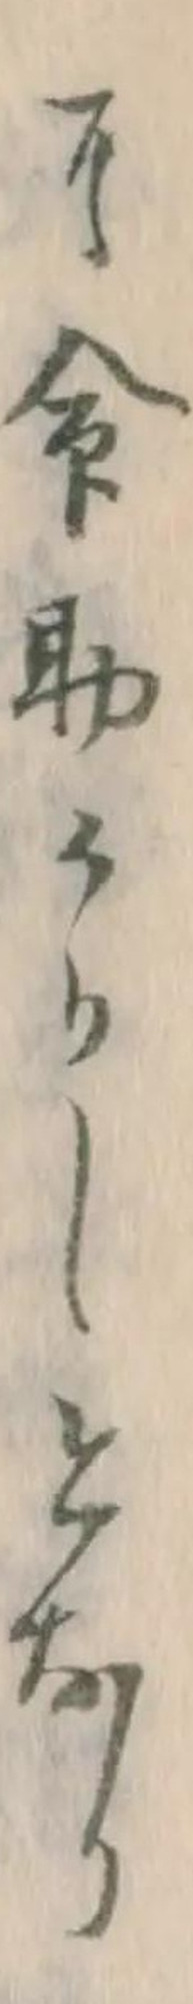に命助かりしとなり
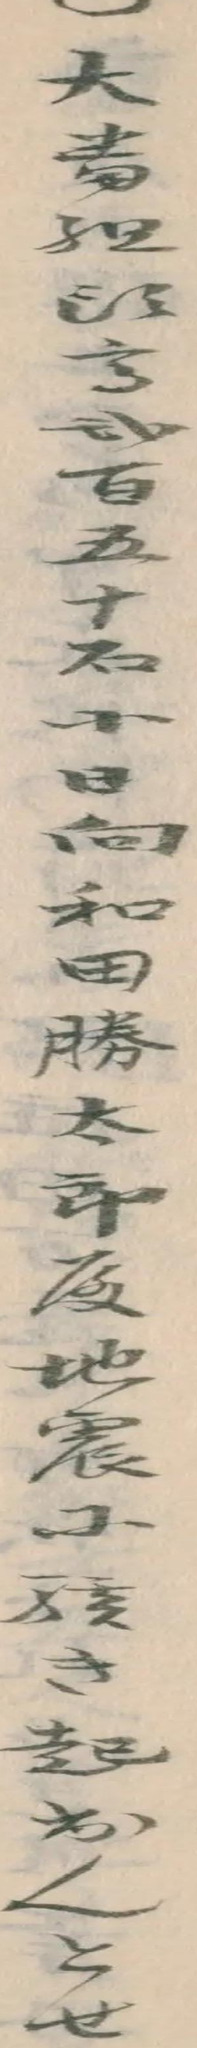〇大番組頭高弐百五十石小日向和田勝太郎殿地震に駭き起出んとせ
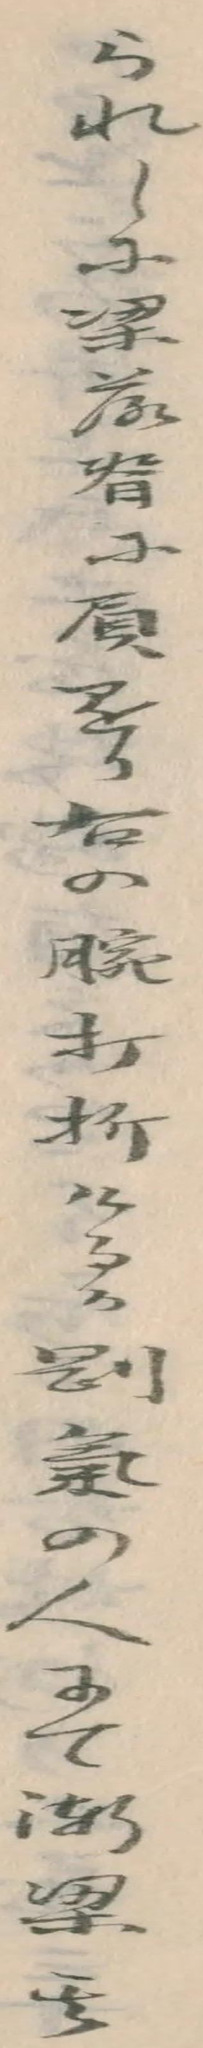られしに梁落背に負懸り右の腕打折けるか剛気の人にて漸梁其
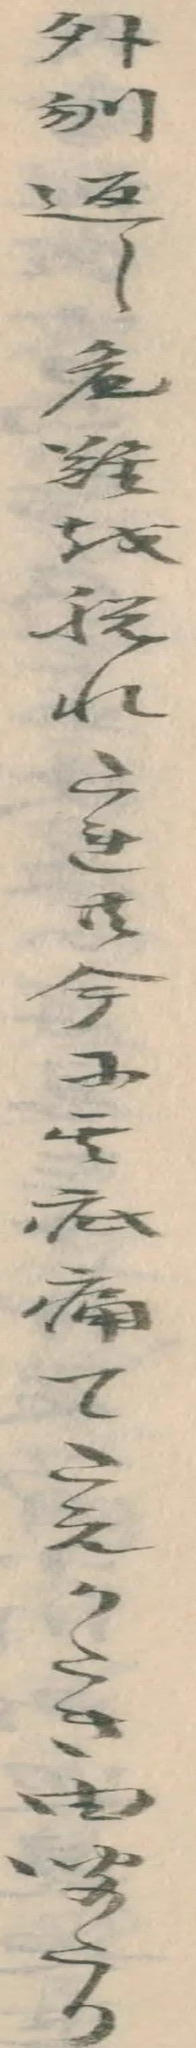外刎返し危難を脱れたれ共今に其疵痛てたえかたき由聞たり

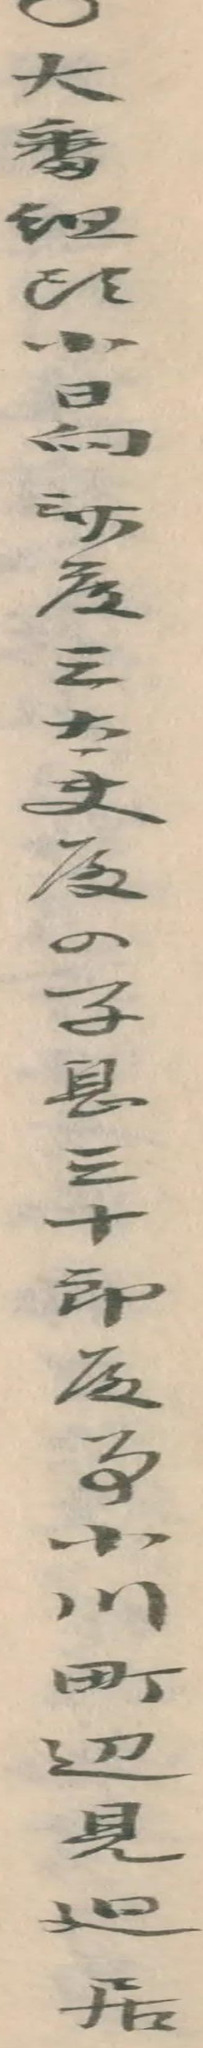〇大番組頭小日向斉藤三太夫殿の子息三十郎殿事小川町辺見廻居
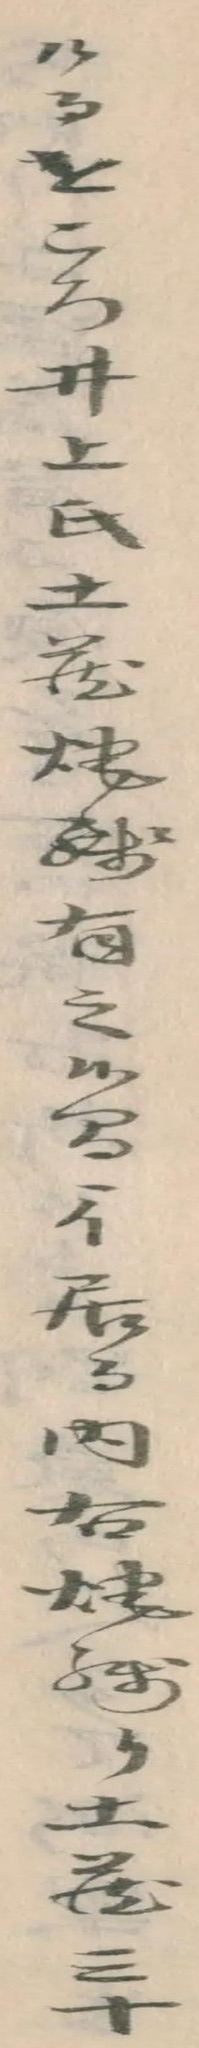けるところ井上氏土蔵焼残有之候間彳居る内右焼残り土蔵三十
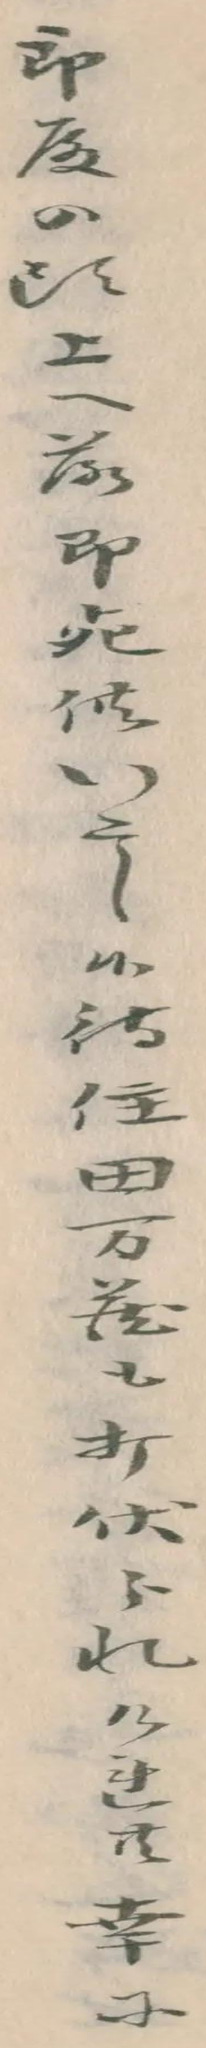郎殿の頭上へ落即死供いたし候待住田万蔵も打伏られけれ共幸に
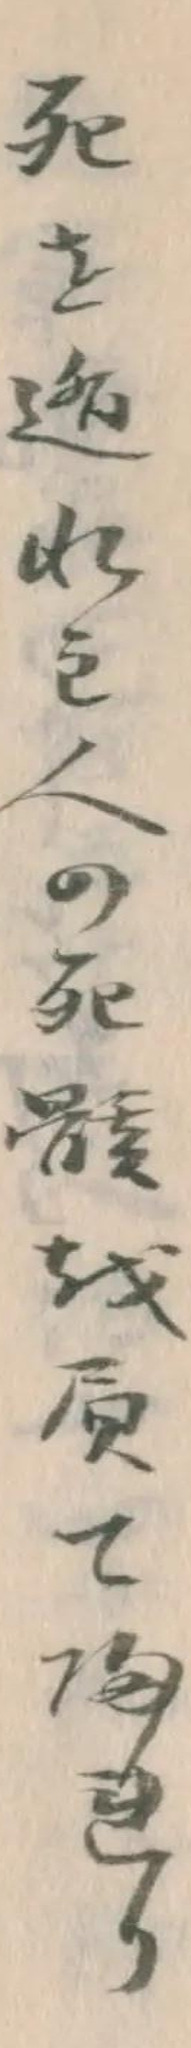死を遁れ主人の死骸を負て帰れり
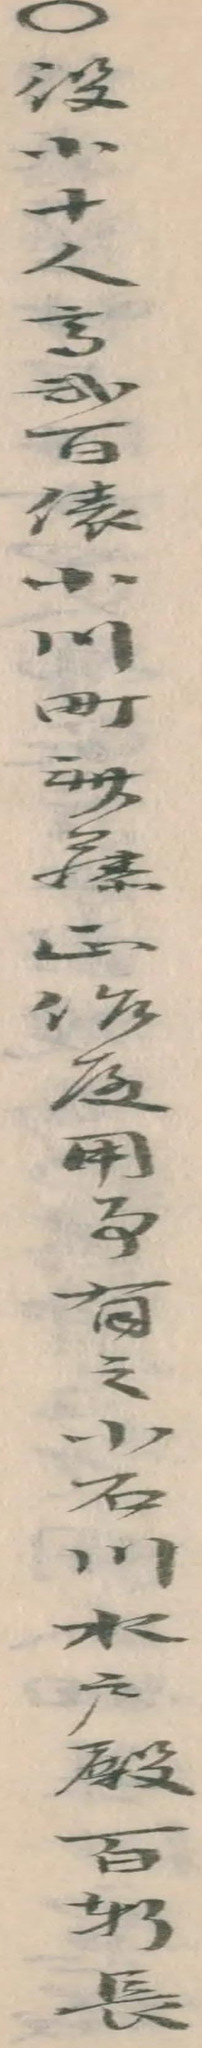〇役小十人高弐百俵小川町斉藤正作殿用事有之小石川水戸殿百軒長
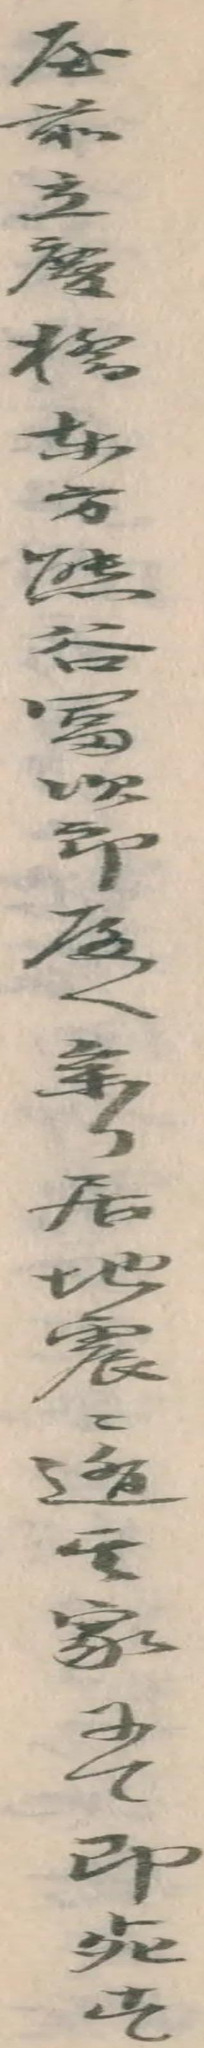屋前立慶橋東方熊谷冨次郎殿へ参り居地震に逢其家にて即死す
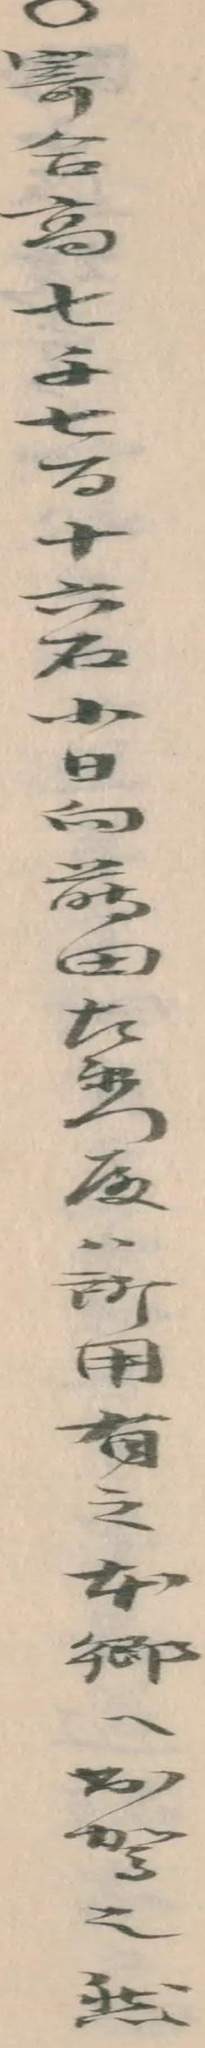〇寄合高七千七百十六石小日向蒔田左衛門殿は所用有之本郷へ出駕也然
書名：地災撮要. 巻10(地震之部) 上,下
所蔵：国立国会図書館 National Diet Library, JAPAN
